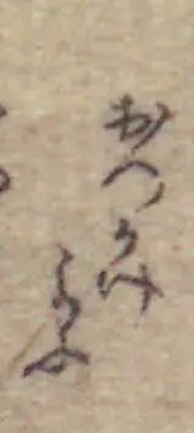おつかけ
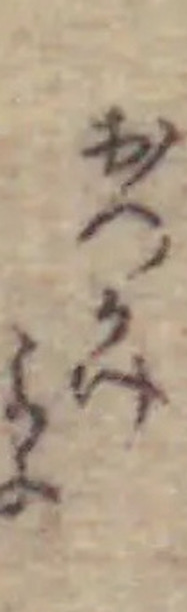おつかけ
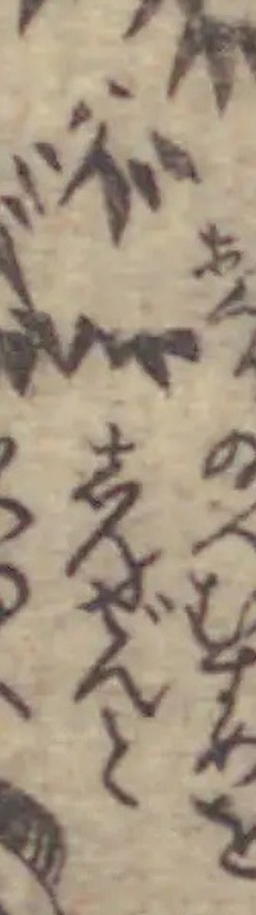しんぜんと
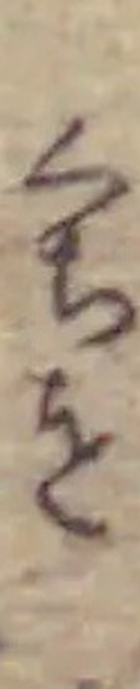くちを
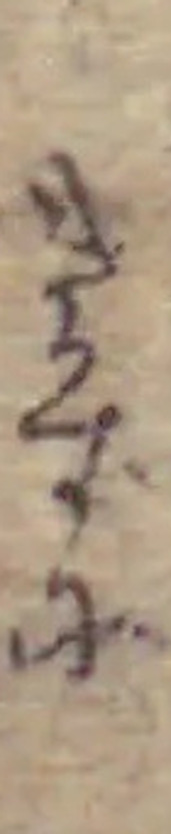きかずに
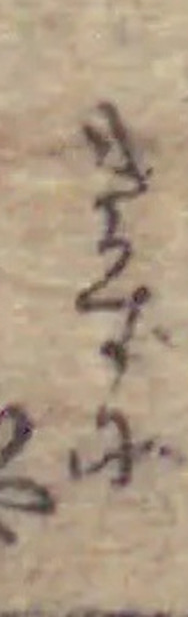きかずに
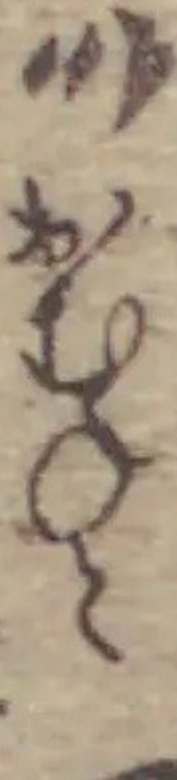おむねと
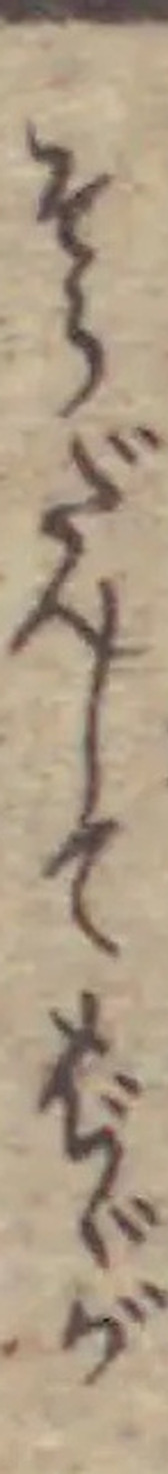そうだんしてばゞが
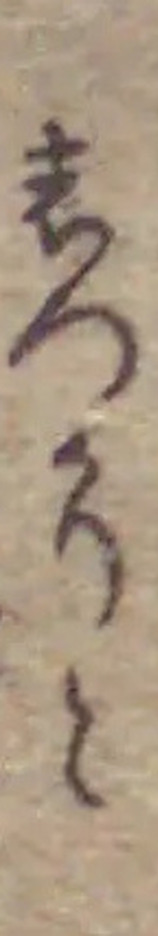しつかりと
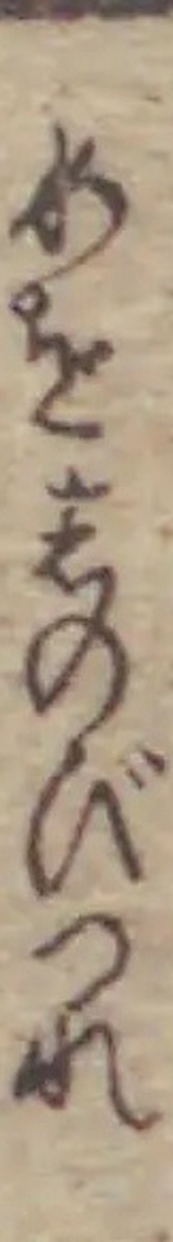めをしのびつれ
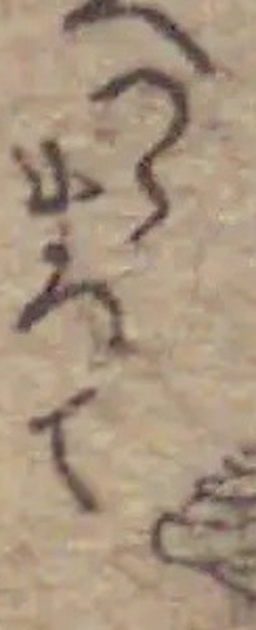まつて
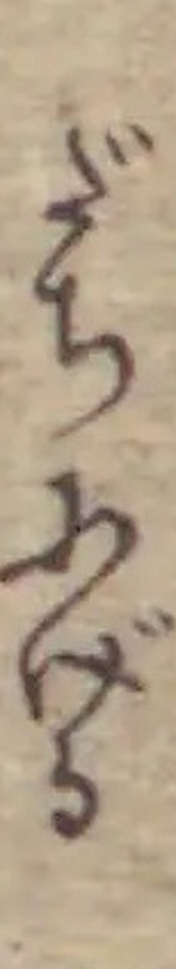だちにげる
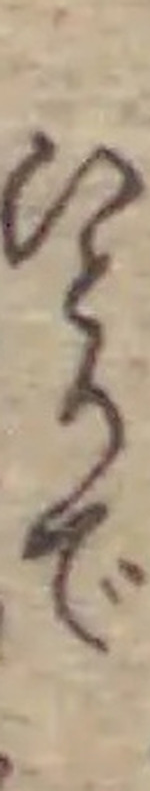ひとりで
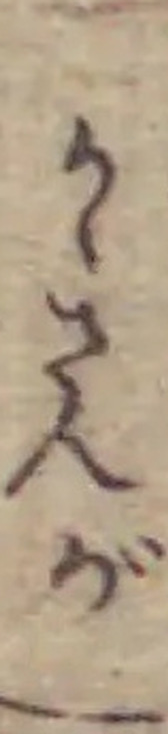かゝさんが
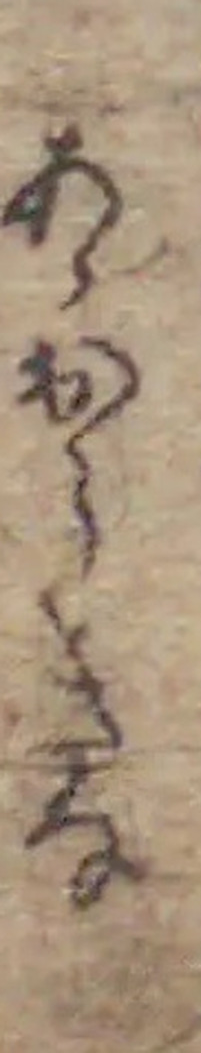あゝおうきな
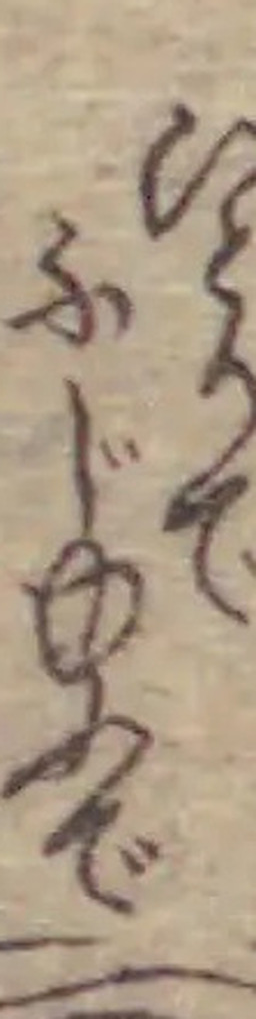ふじゆふで
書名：奥州咄 3巻
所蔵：国立国会図書館 National Diet Library, JAPAN
